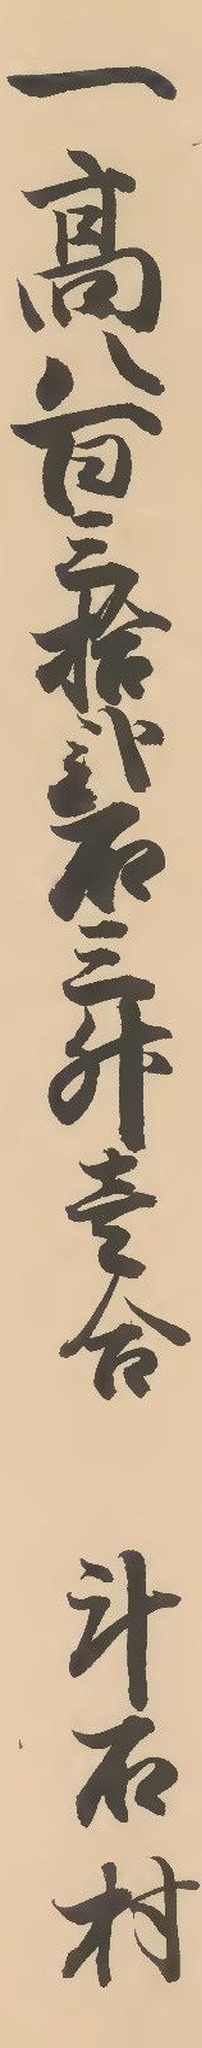一髙八百三拾弐石三升壱合斗石村
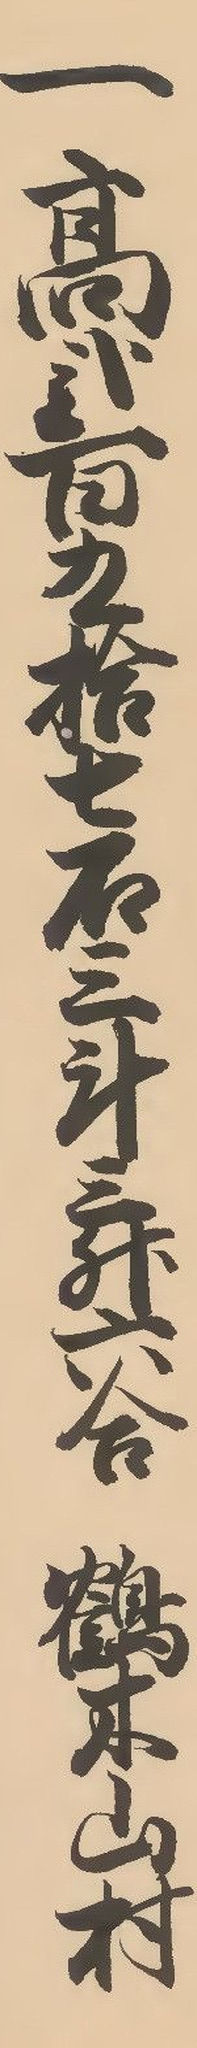一髙弐百九拾七石三斗三升六合鶴木山村
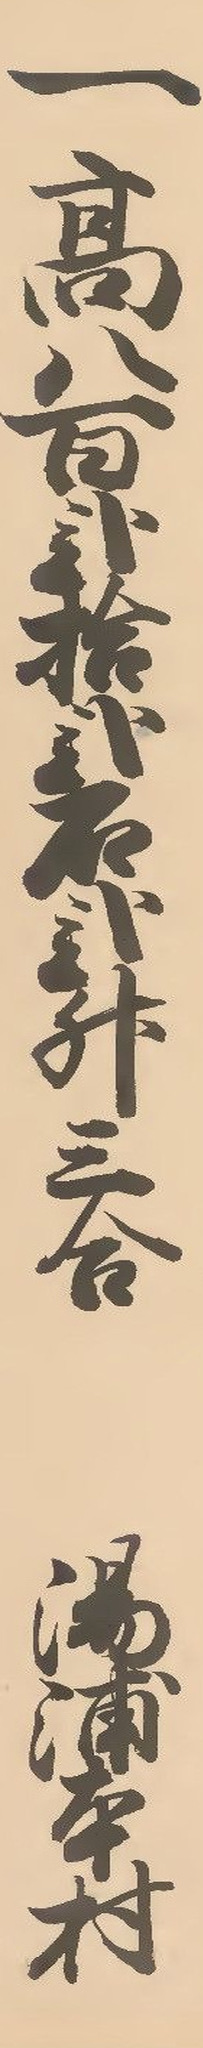一髙八百弐拾弐石弐升三合湯浦本村
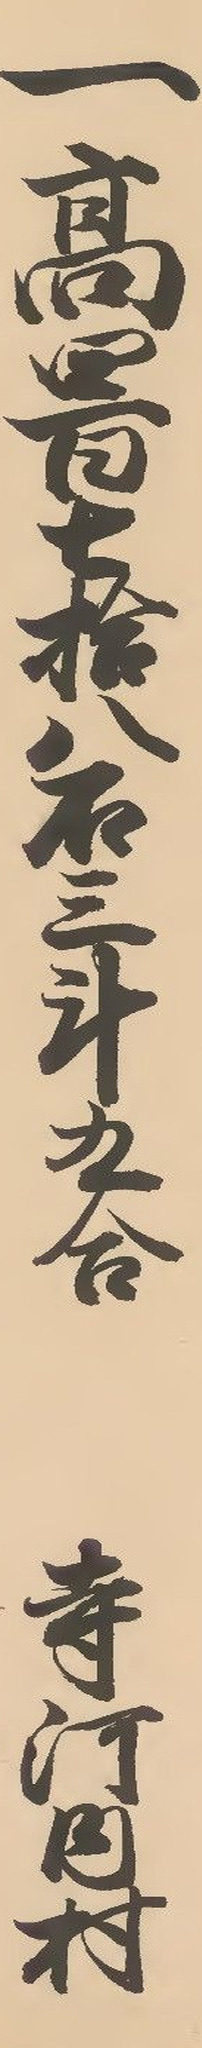一髙四百七拾八石三斗九合寺河内村
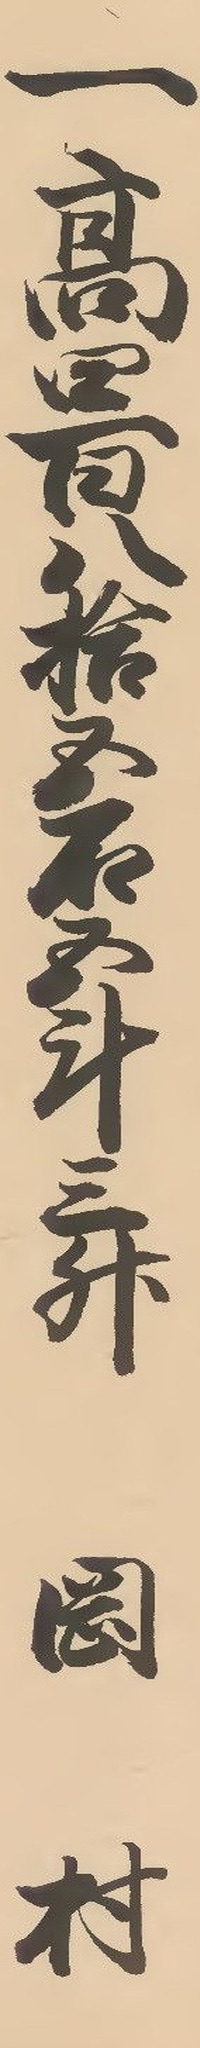一髙四百八拾五石五斗三升岡村
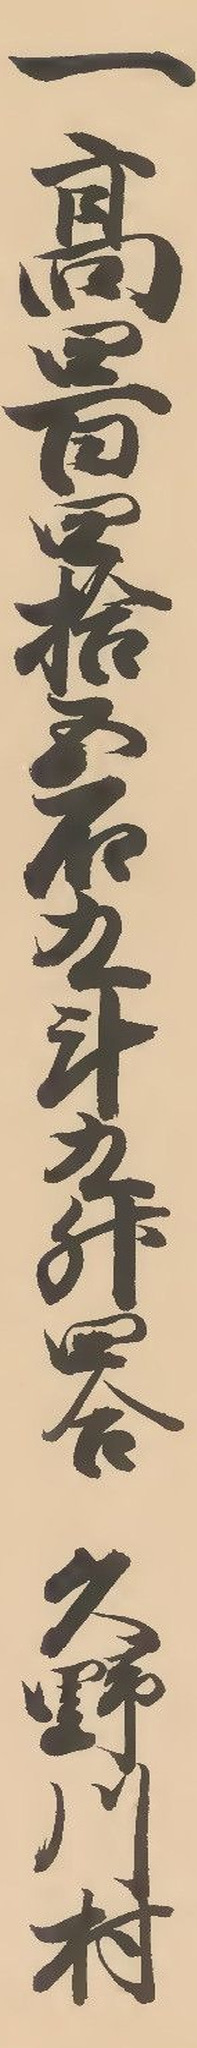一髙四百四拾五石九斗九升四合久野川村

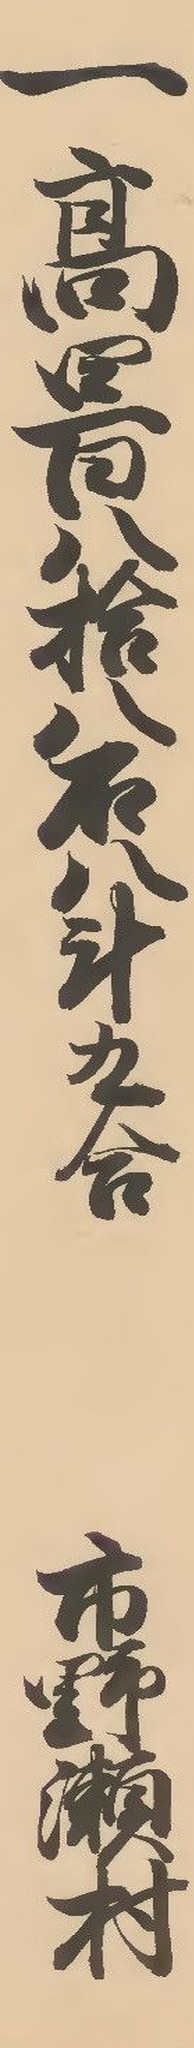一髙四百八拾八石八斗九合市野瀬村
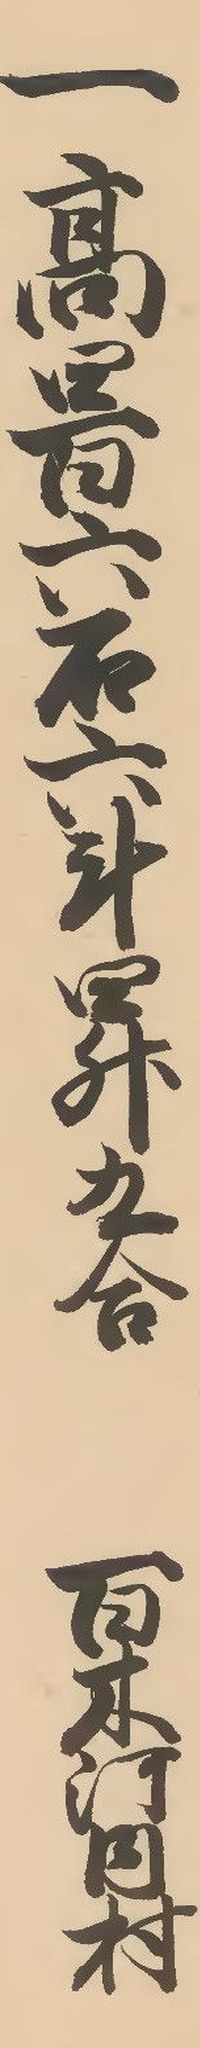一髙四百六石六斗四升九合百木河内村
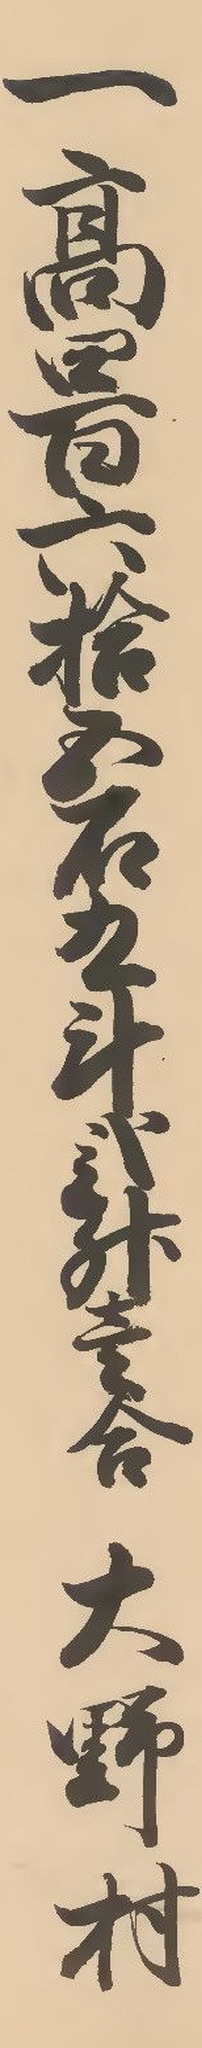一髙四百六拾五石九斗弐升壱合大野村
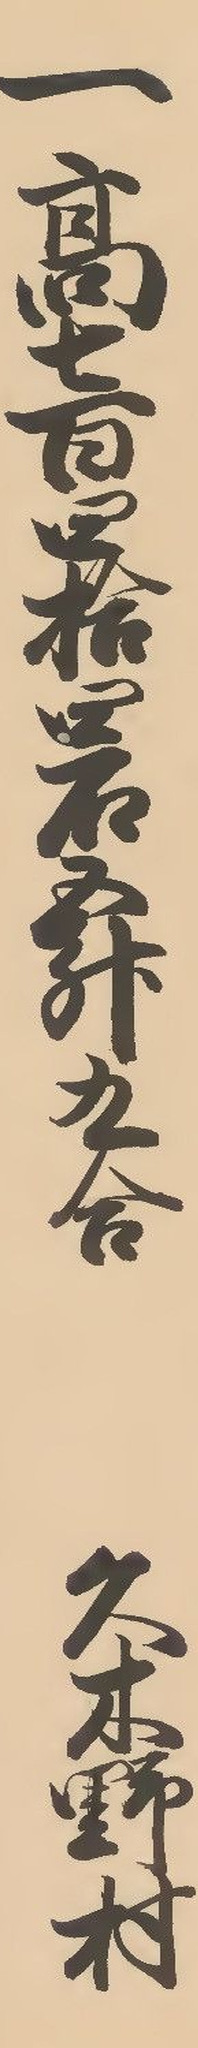一髙七百四拾四石五升九合久木野村
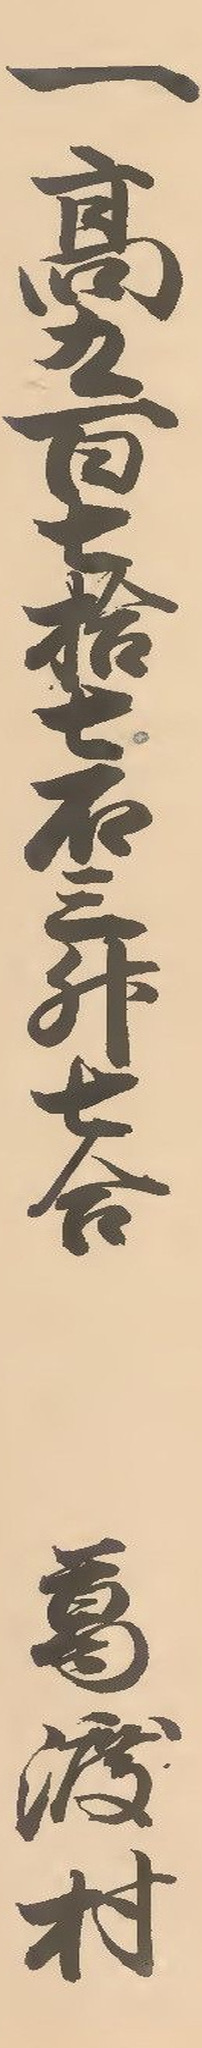一髙九百七拾七石三升七合葛渡村
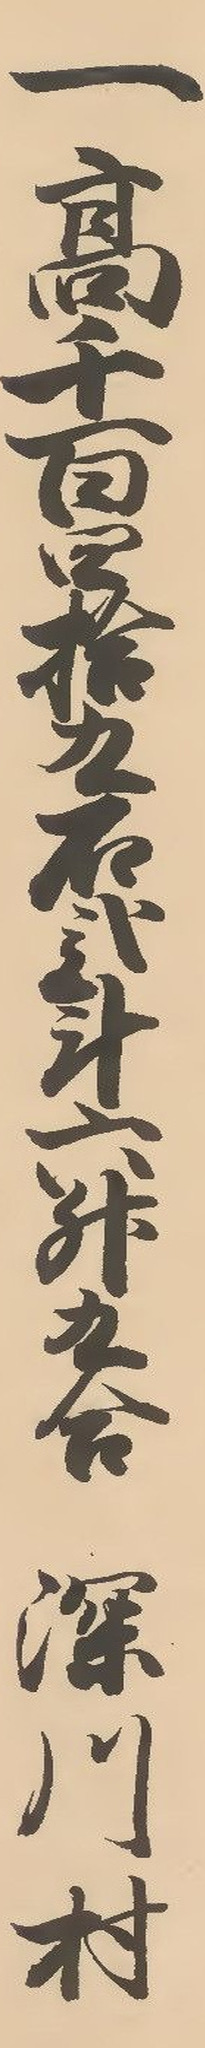一髙千四百四拾九石弐斗六升九合深川村
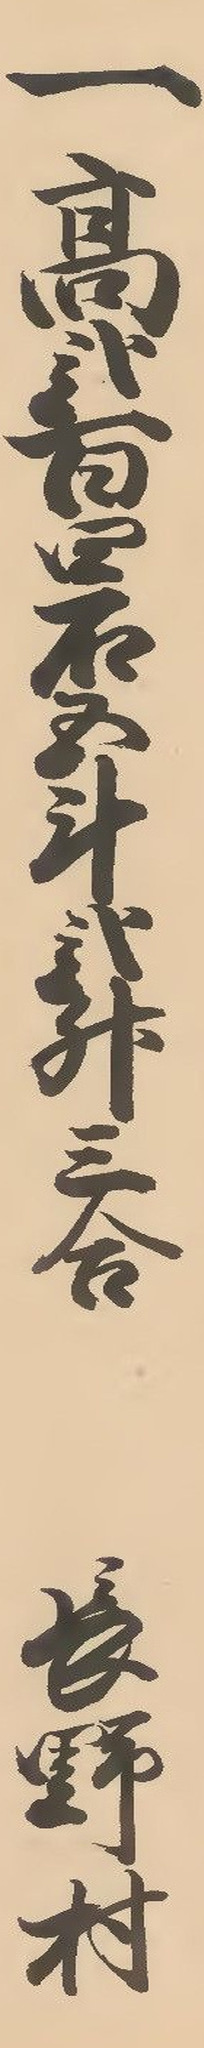一髙弐百四石五斗弐升三合長野村
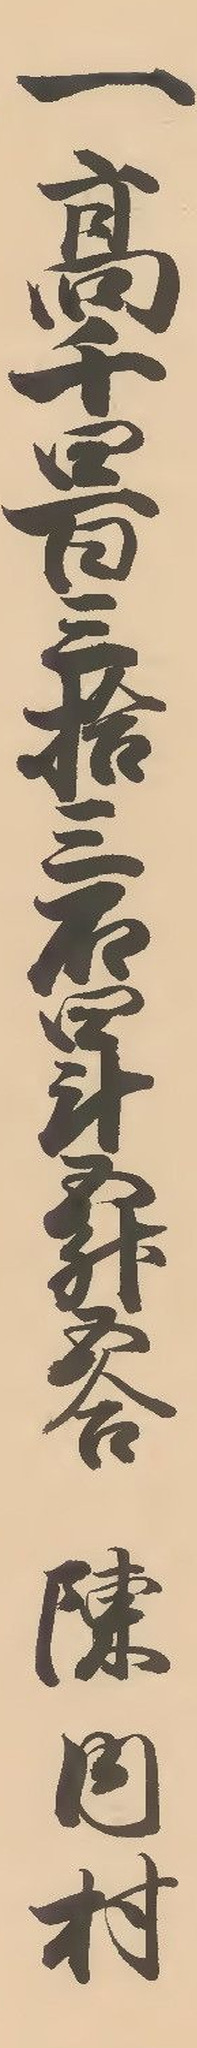一髙千四百三拾三石四斗五升五合陳内村

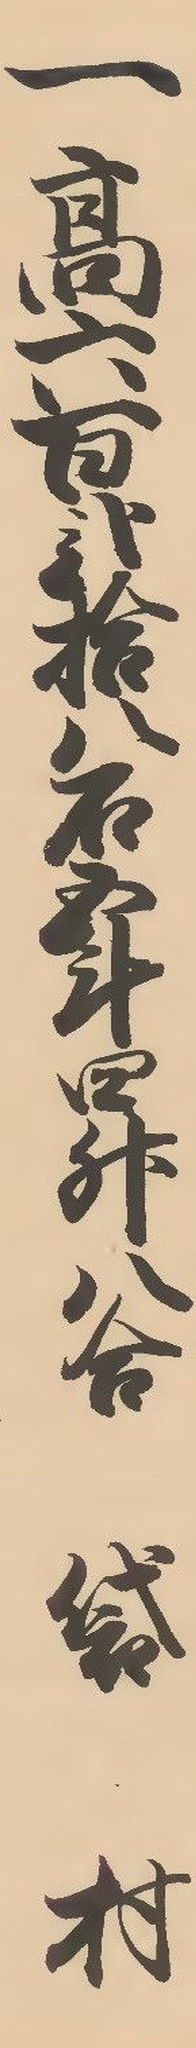一髙六百弐拾八石五斗四升八合袋村
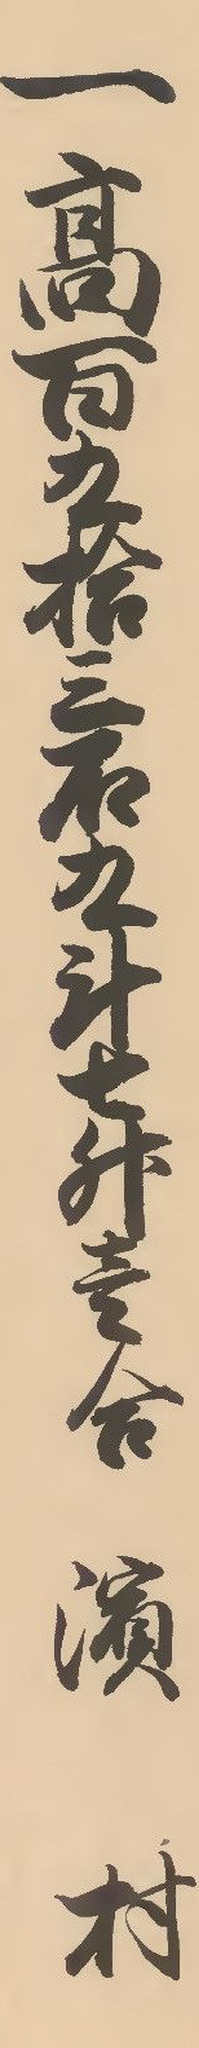一髙百九拾三石九斗七升壱合濱村
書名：肥後国郷帳
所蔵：国立公文書館 National Archives of Japan
